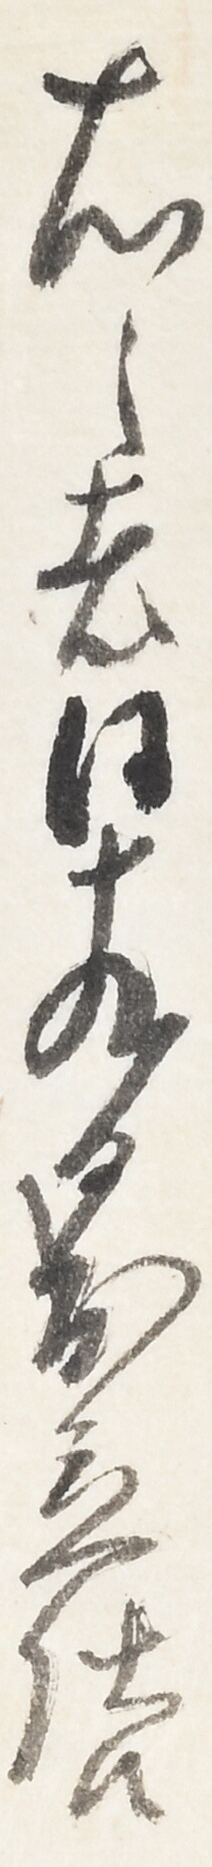右之者同十九日出立仕候
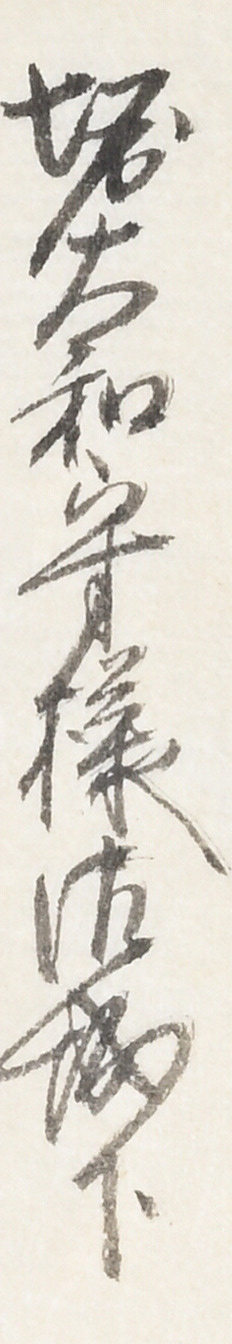堀大和守様御城下
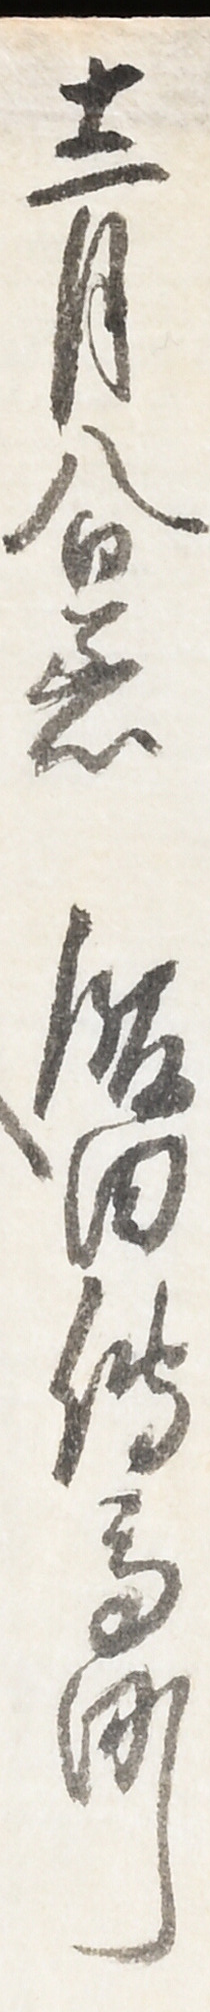十二月八日着飯田伝馬町
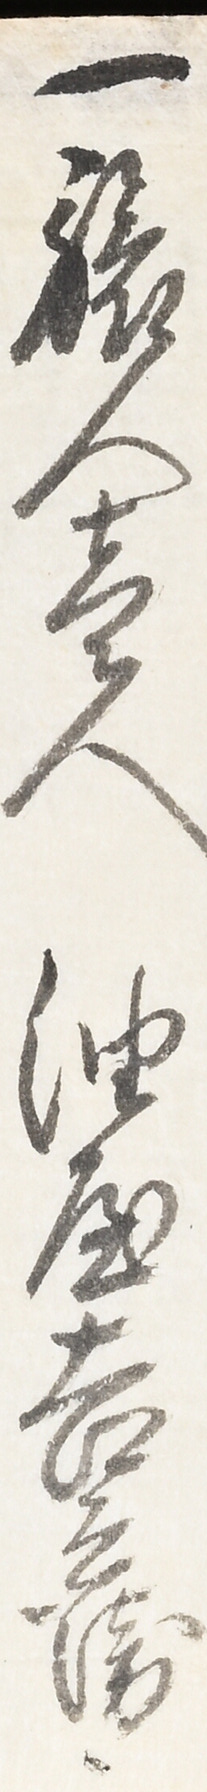一旅人壱人油屋吉兵衛・
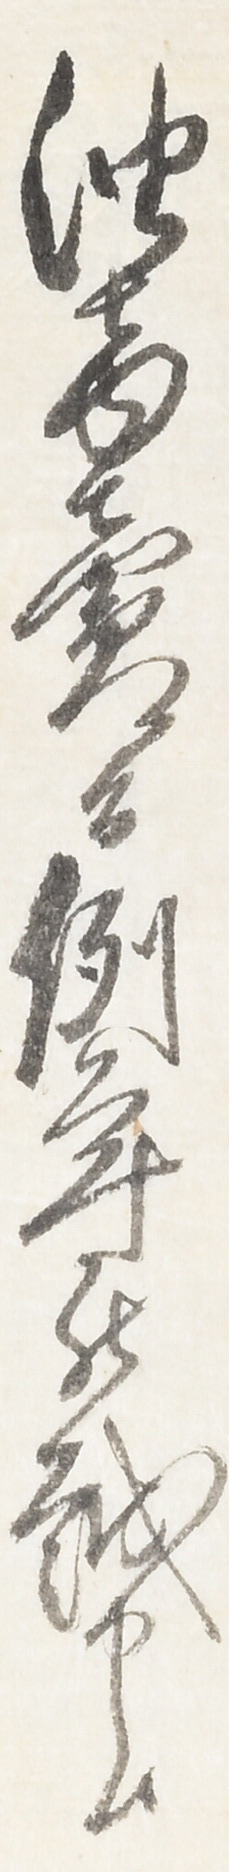油商売ニ而例年罷越申候
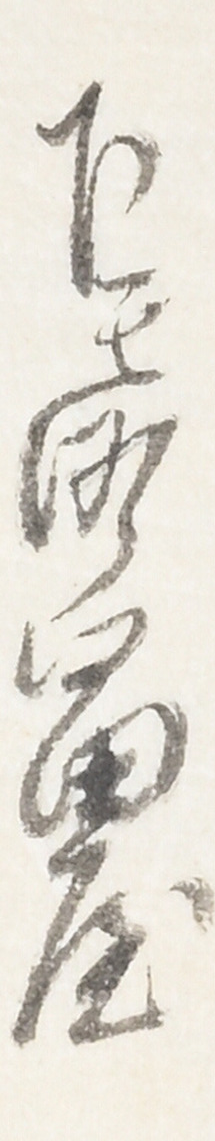下モ町冨屋
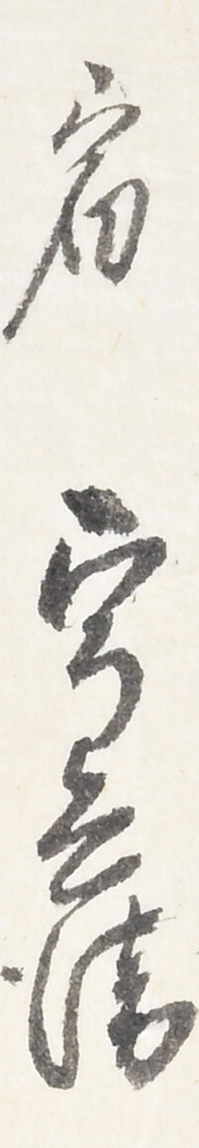宿宇兵衛
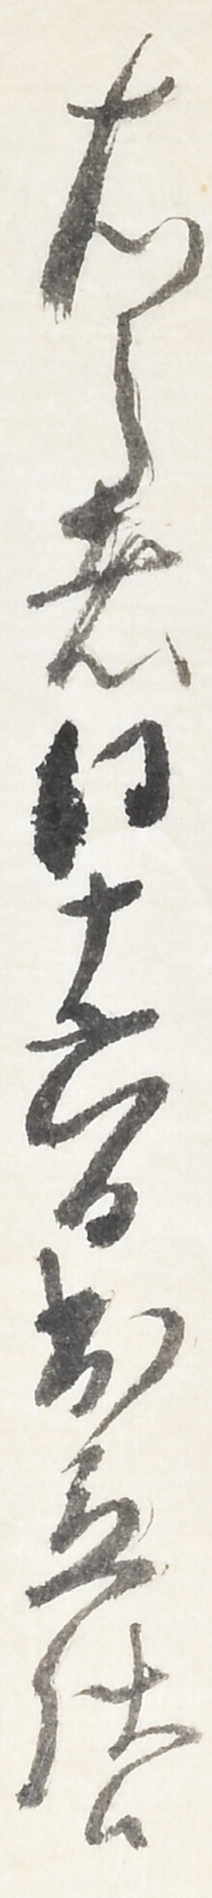右之者同十六日出立仕候
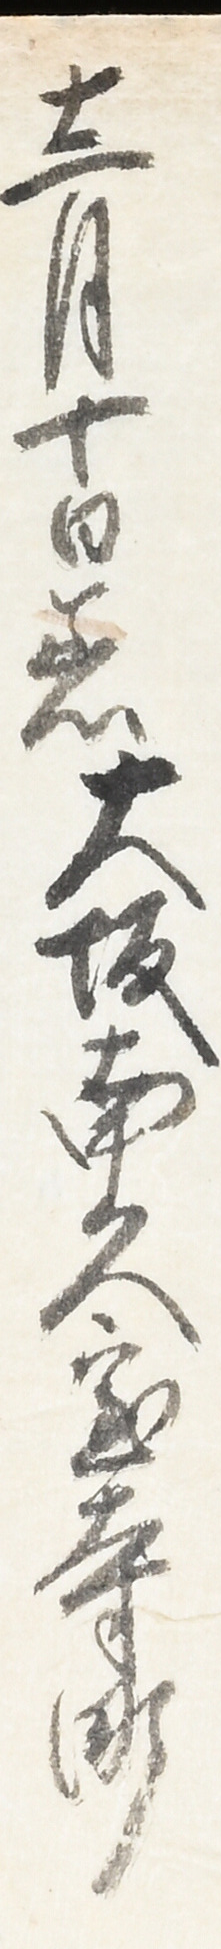十二月十日着大坂南久宝寺町
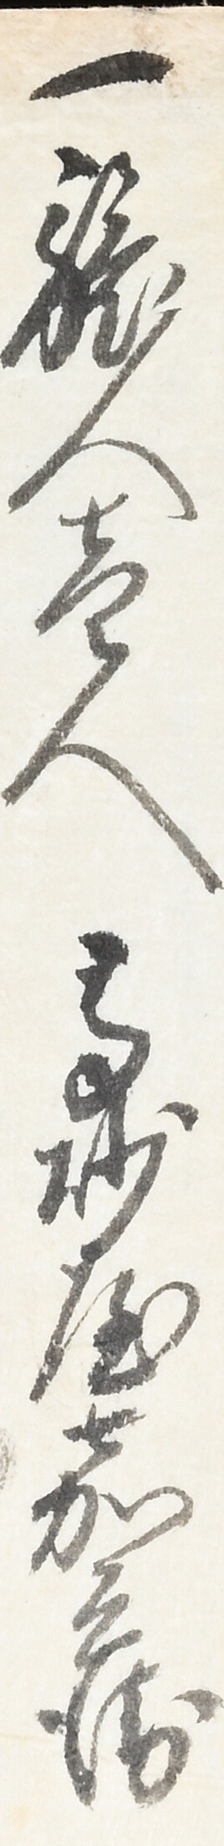一旅人壱人高砂屋嘉兵衛
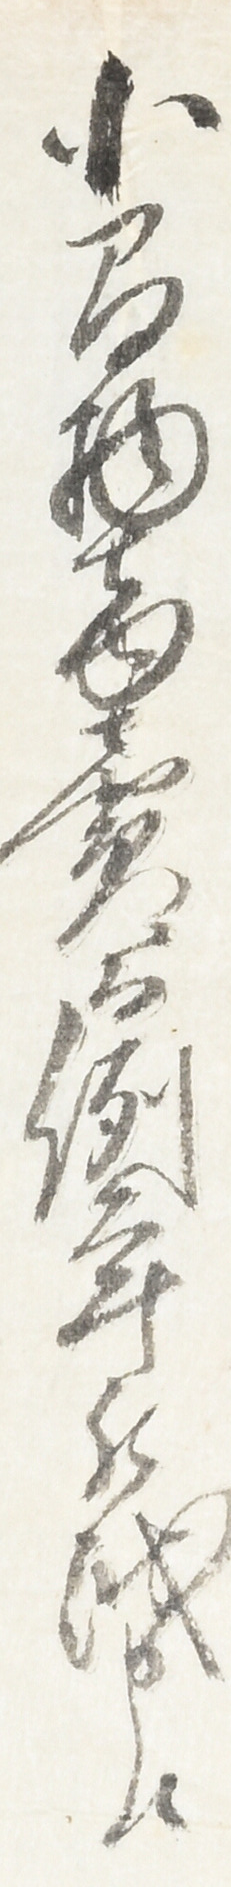小間物商売ニ而例年罷越申候
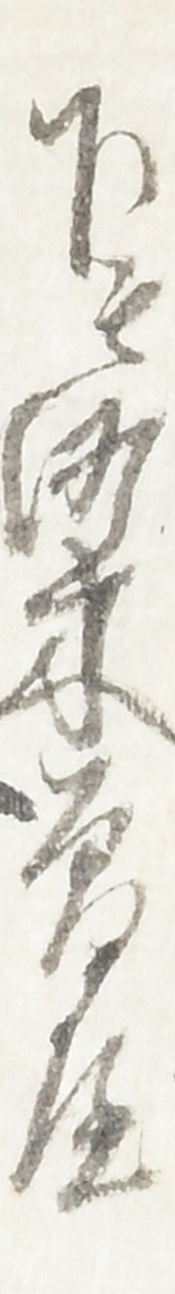下モ町木曽屋
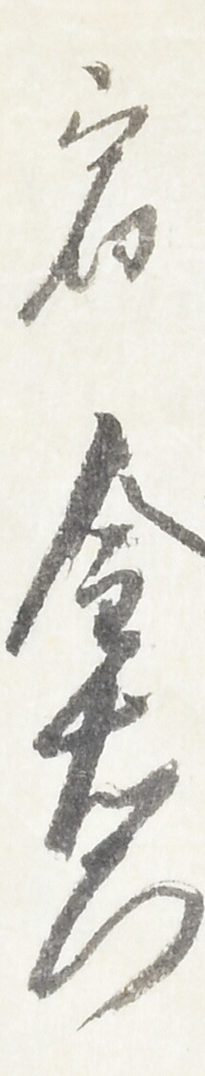宿金右衛門
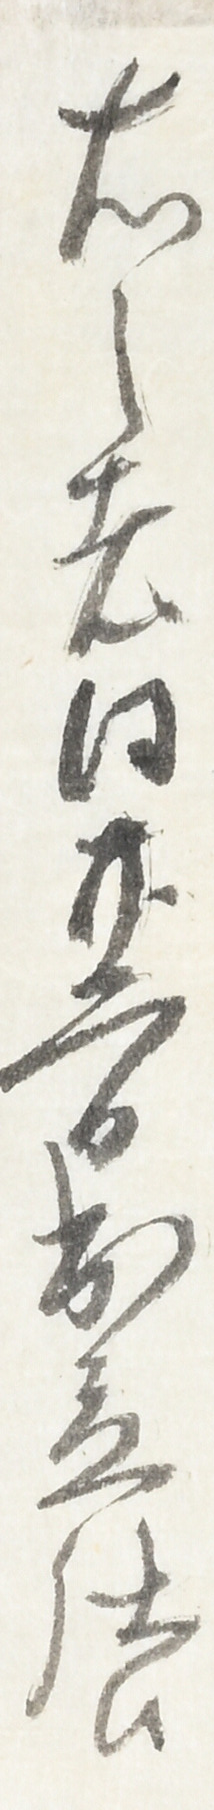右之者同廿二日出立仕候

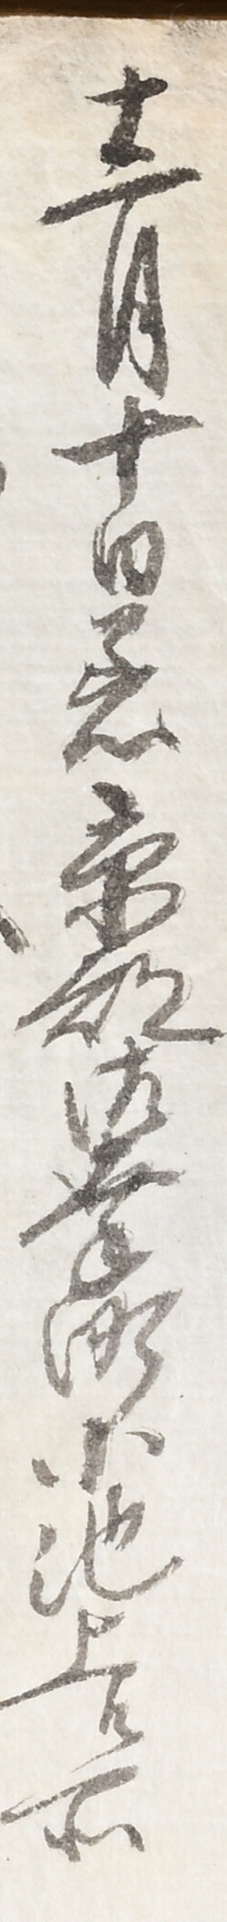十二月十日着京都御幸町小池上ル所
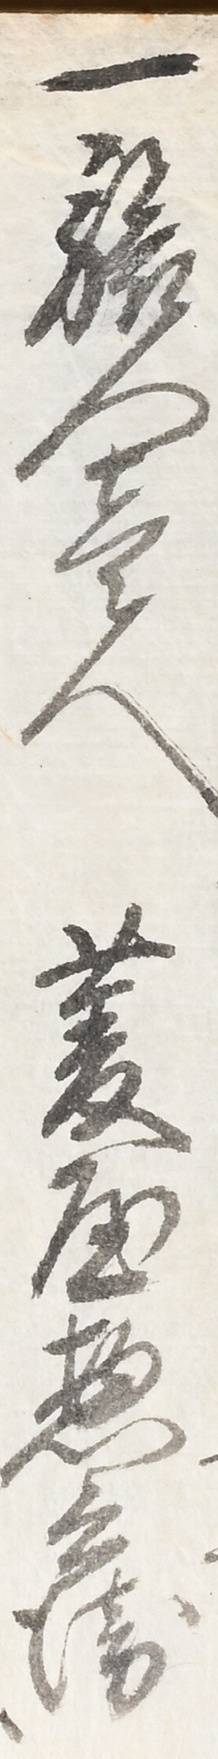一旅人壱人菱屋惣兵衛
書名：旅人泊控帳
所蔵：伊那市立高遠町図書館・合同会社AMANE
